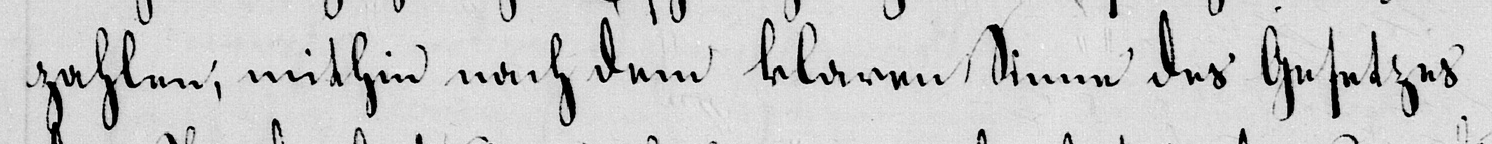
zahlen, mithin nach dem klaren Sinne des Gesetzes
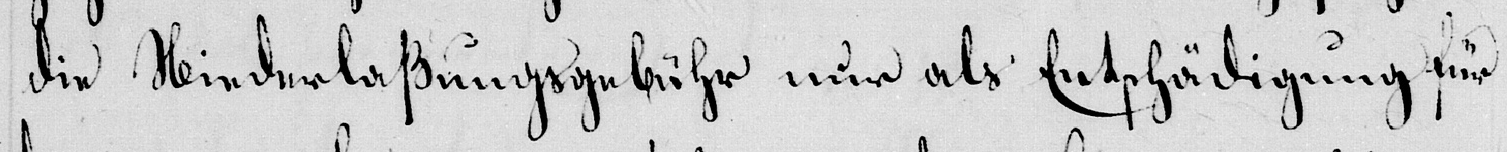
die Niederlaßungsgebühr nur als Entschädigung für
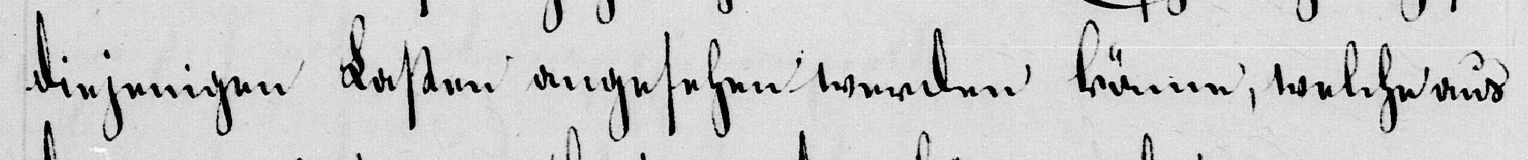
diejenigen Lasten angesehen werden können, welche aus
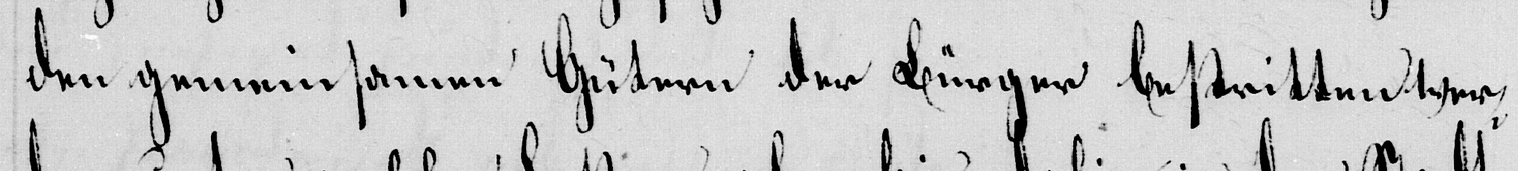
den gemeinsamen Gütern der Bürger bestritten wer¬
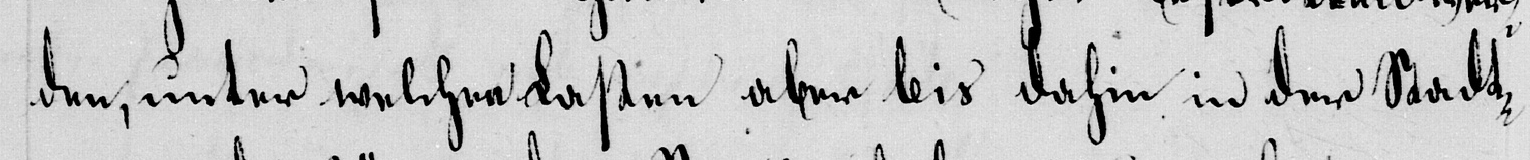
den, unter welchen Lasten aber bis dahin in der Stadt¬
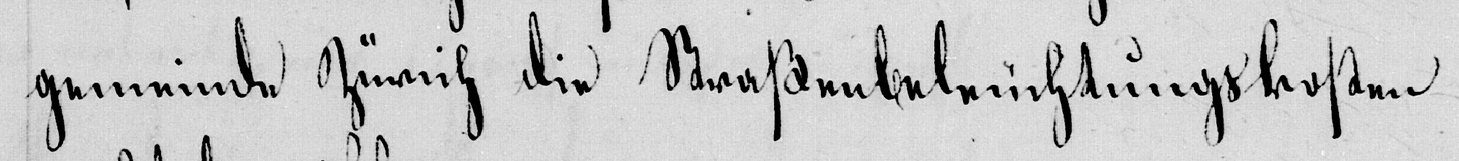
gemeinde Zürich die Straßenbeleuchtungskosten
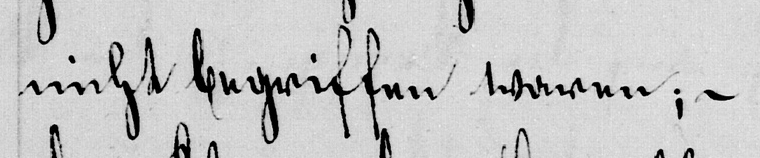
nicht begriffen waren; –
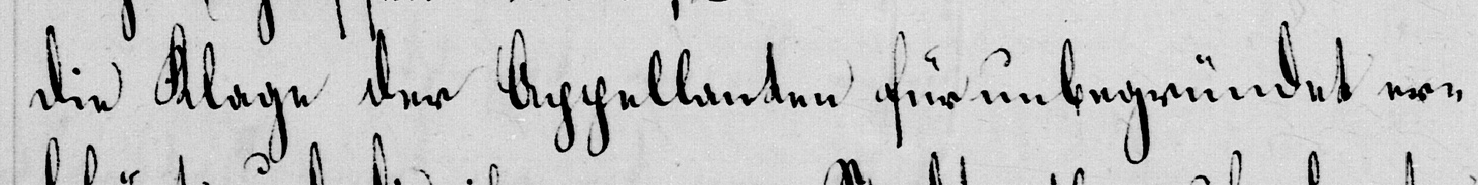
die Klage der Appellanten für unbegründet er¬
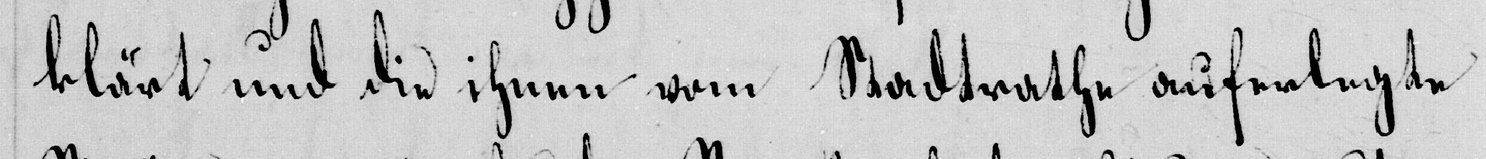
klärt und die ihnen vom Stadtrathe auferlegte
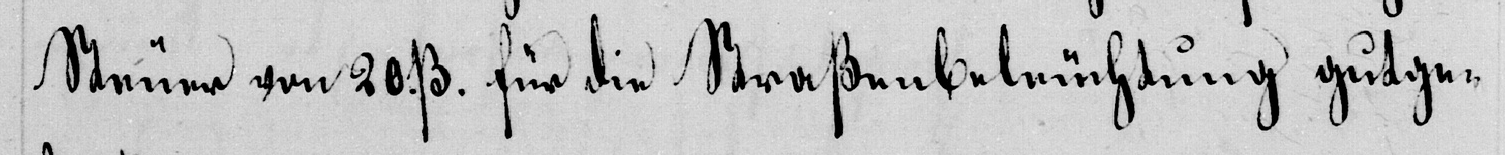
Steuer von 20. ß. für die Straßenbeleuchtung gutge¬
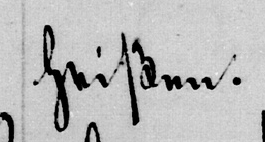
heißen.
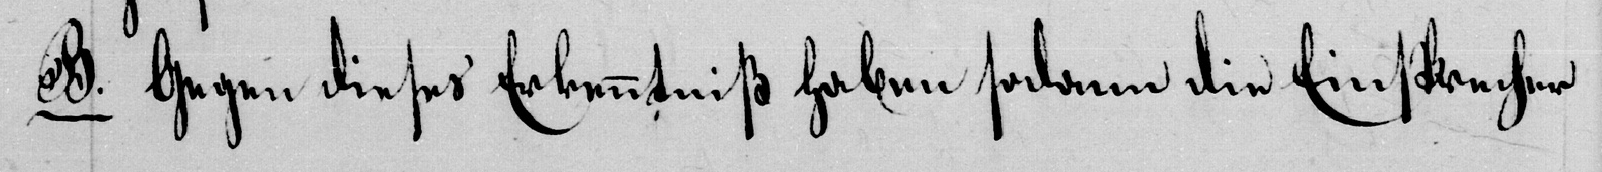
B. Gegen dieses Erkenntniß haben sodann die Einsprecher
